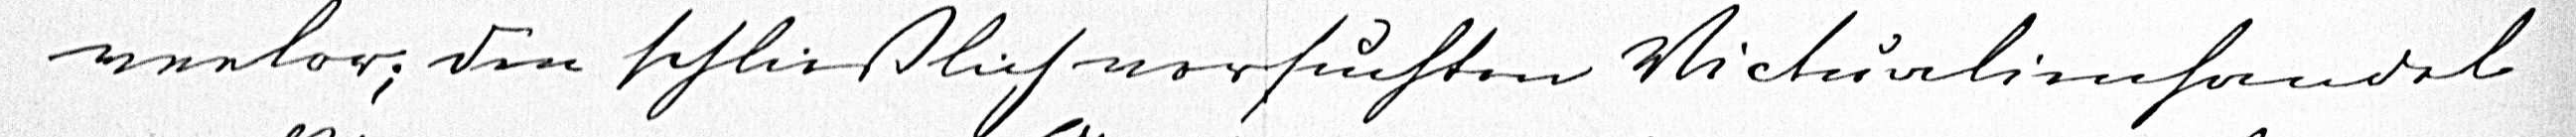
verlor; die schließlich versuchten Victualienhandel
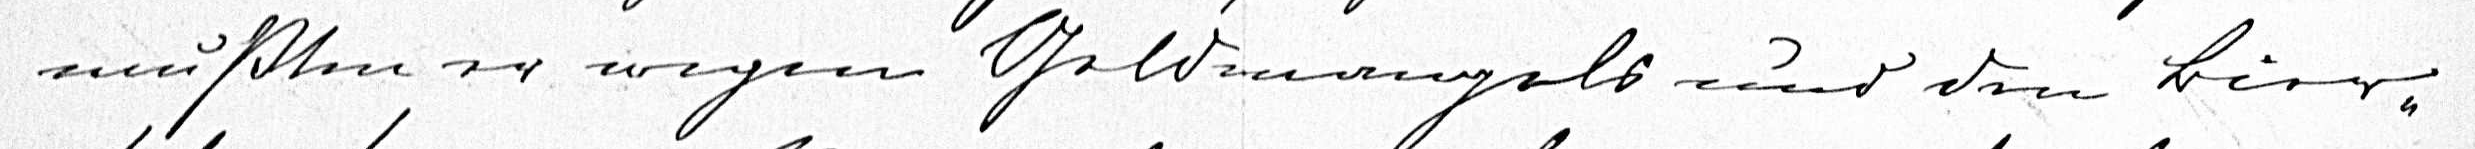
mußten er wegen Geldmangels und den Bier¬
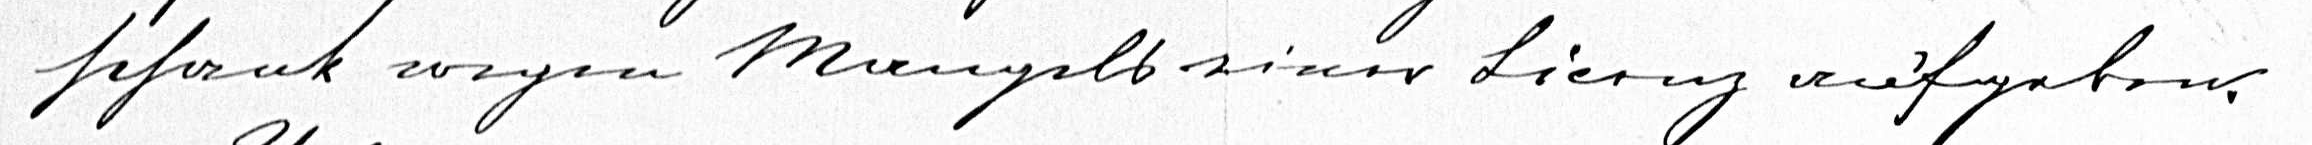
schank wegen Mangels einer Licenz aufgeben.
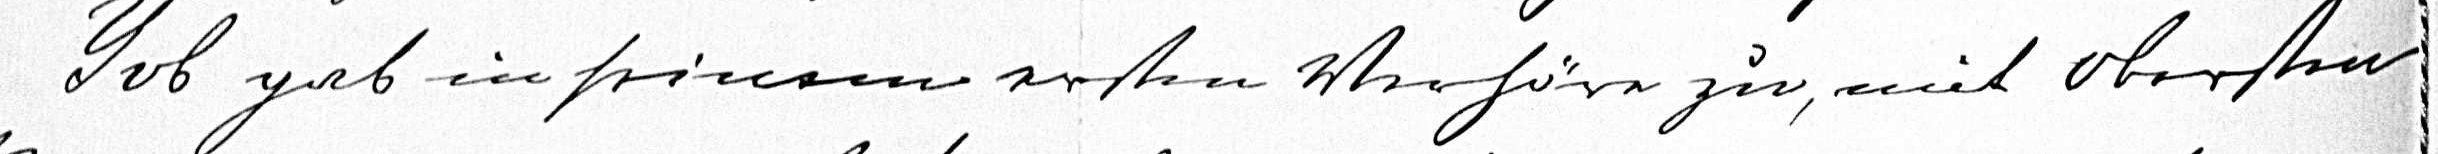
Job gab in seine ersten Verhöre zu, mit Obersten
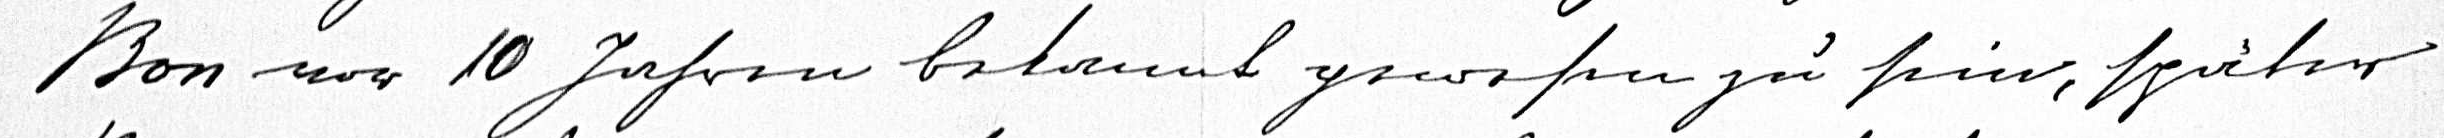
Bon vor 10 Jahren bekannt gewesen zu sein, später
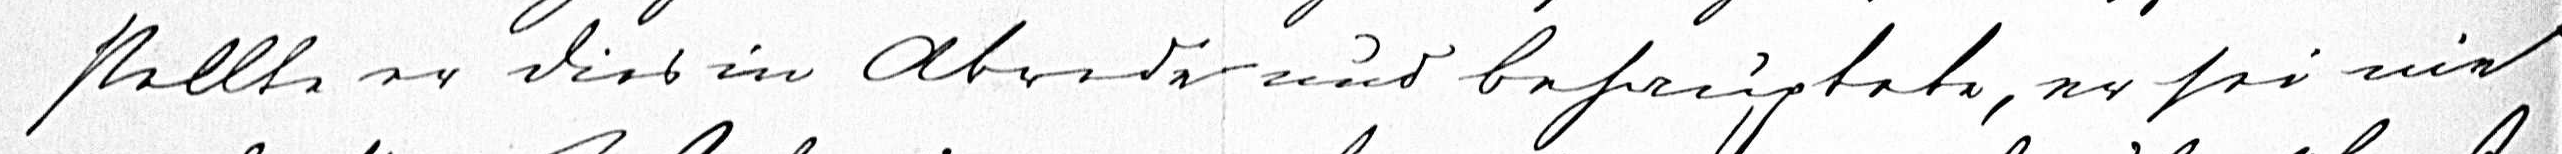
stellte er dies in Abrede und behauptete, er sei nie
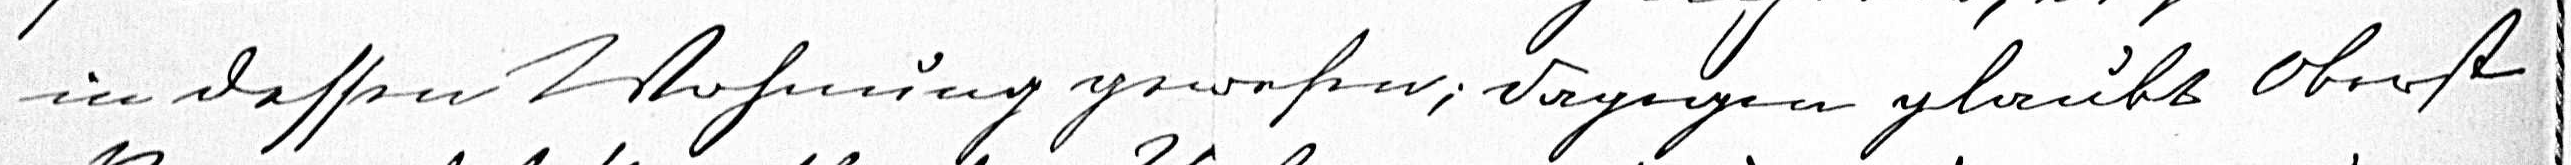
in dessen Wohnung gewesen; dagegen glaubt Oberst
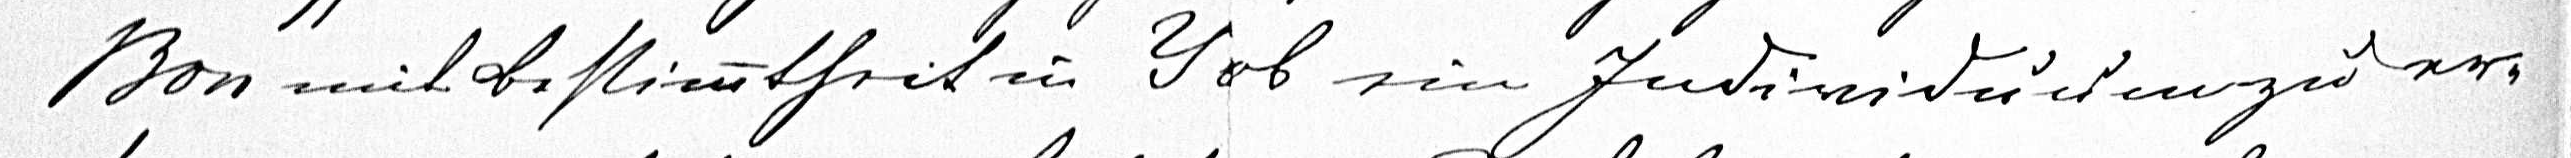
Bon mit bestimmtheit in Yob ein Individuum zu er¬
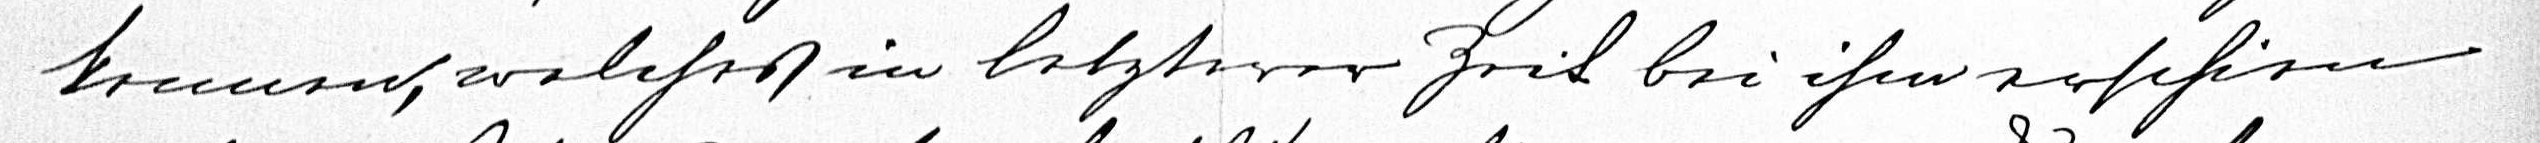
kennen, welches in letzterer Zeit bei ihm erschien
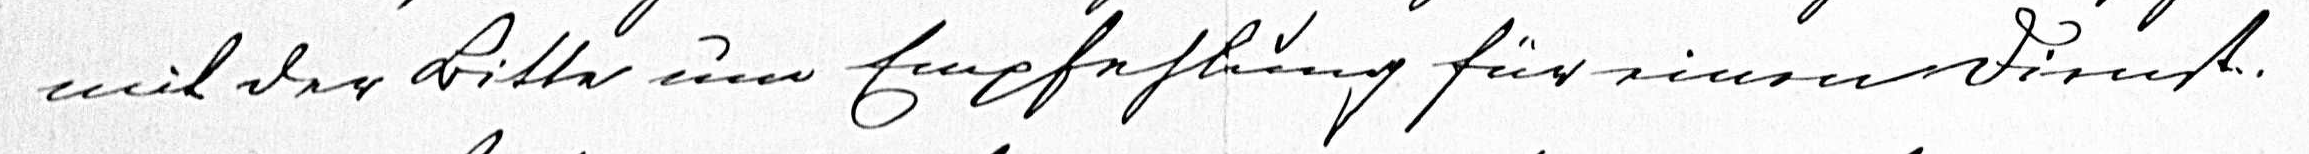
mit der Bitte um Empfehlung für einen Dienst.
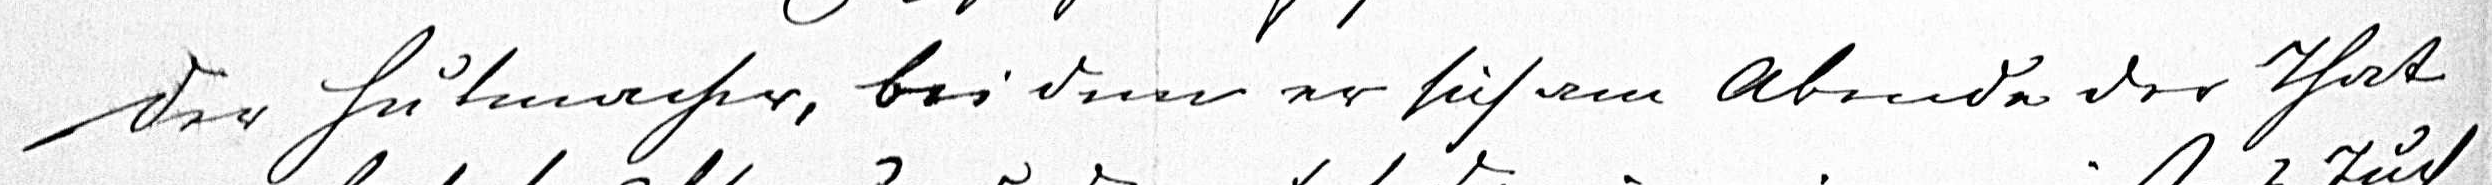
Der Hutmacher, bei dem er sich am Abende der That
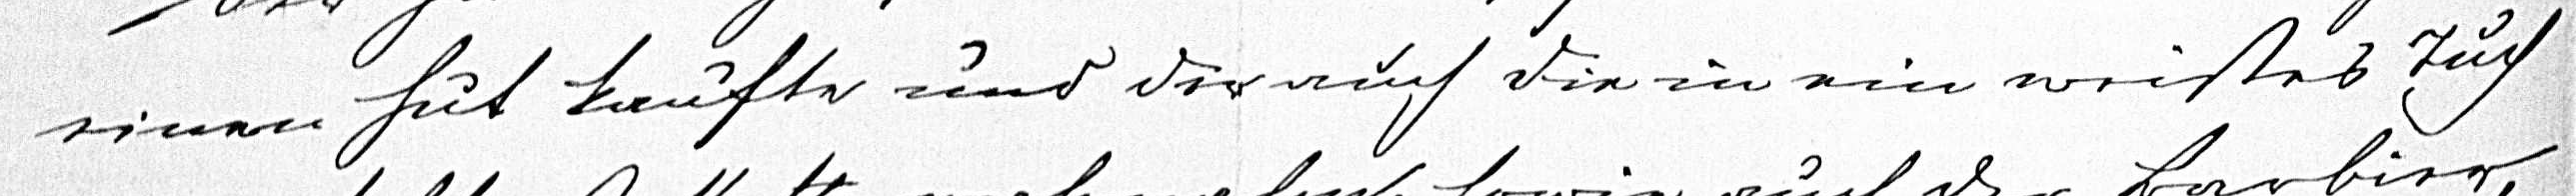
einen Hut kaufte und der auch die in ein weißes Tuch
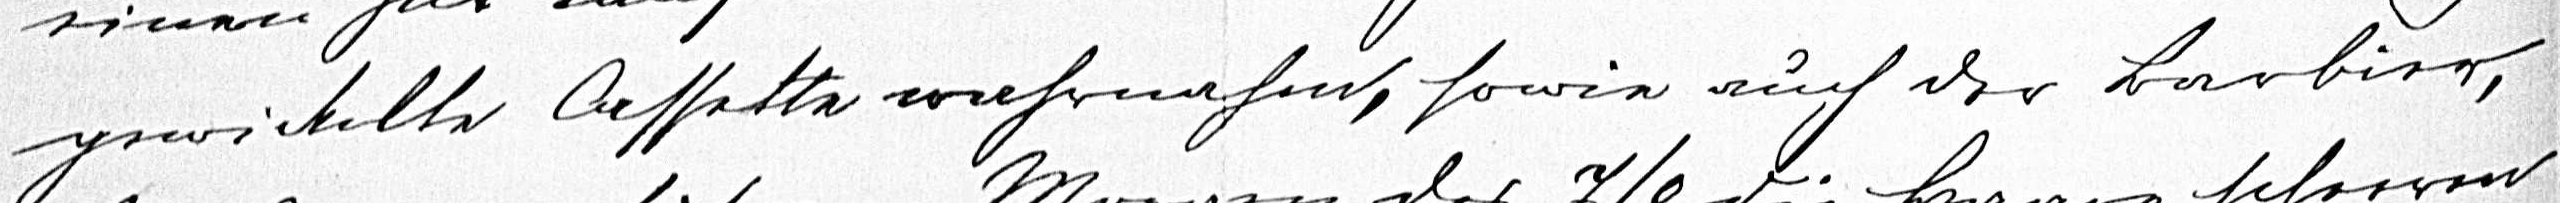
gewickelte Cassette wahrnahm, sowie auch der Barbier,
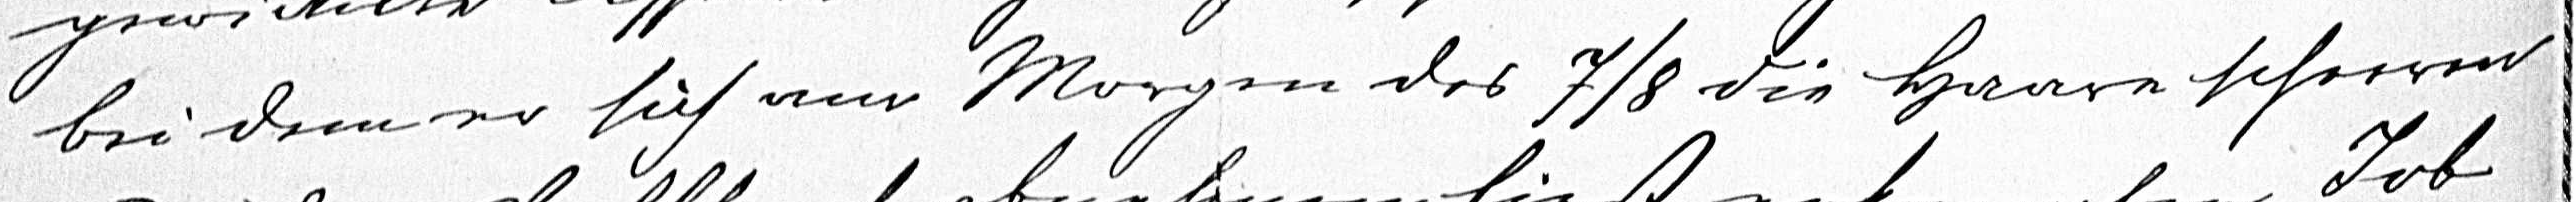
bei dem er sich am Morgen des 7/8 die Haare scheeren
